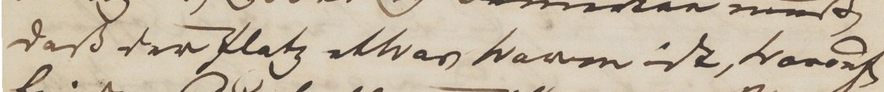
daß der Platz etwas warm ist, worauf
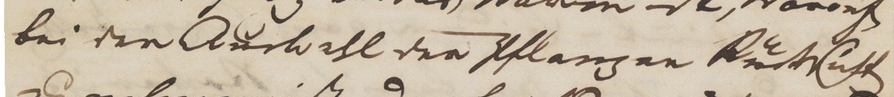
bei der Auswahl der Pflanzen Rücksicht
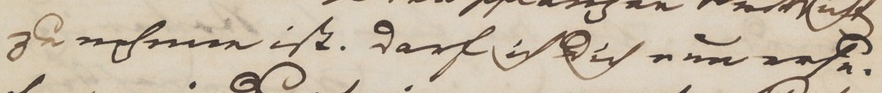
zu nehmen ist. Darf ich dich nun ersu-
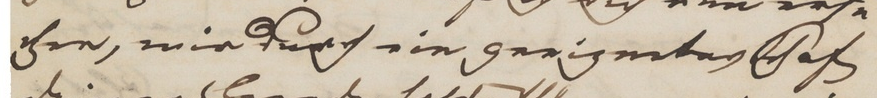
chen, mir durch ein geeignetes Schaf
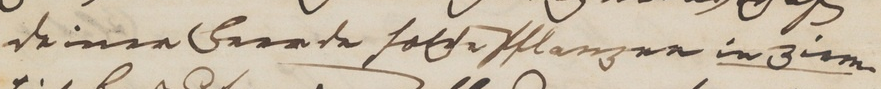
Deiner Heerde solche Pflanzen in ziem-
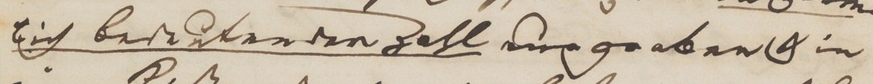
lich bedeutender Zahl ausgraben & in
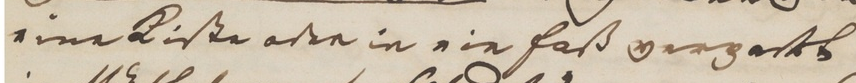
eine Kiste oder in ein Faß verpackt
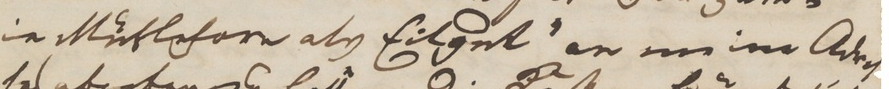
in Mühlehorn als «Eilgut» an meine Adres-
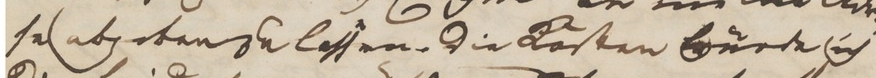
se abgeben zu lassen. Die Kosten würde ich
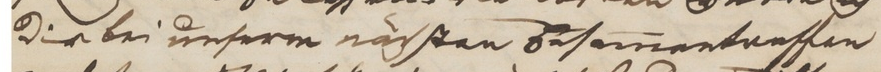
dir bei unserm nächsten Zusammentreffen
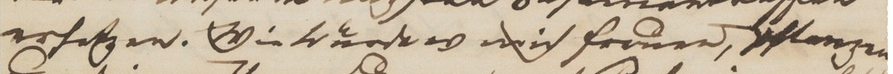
ersetzen. Wie würde es mich freuen, Pflanzen
